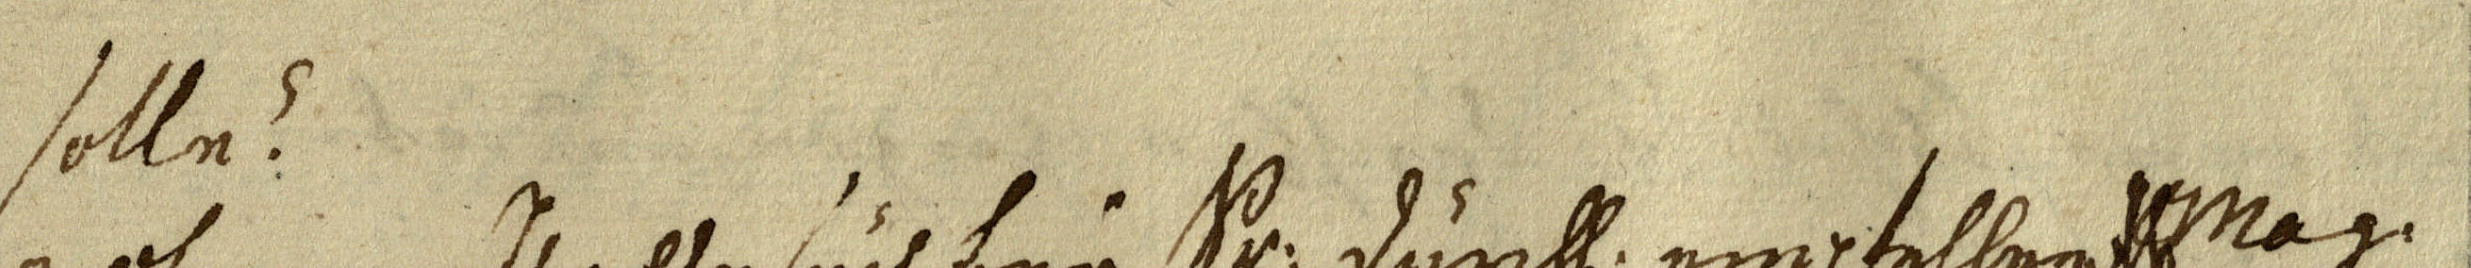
solle?
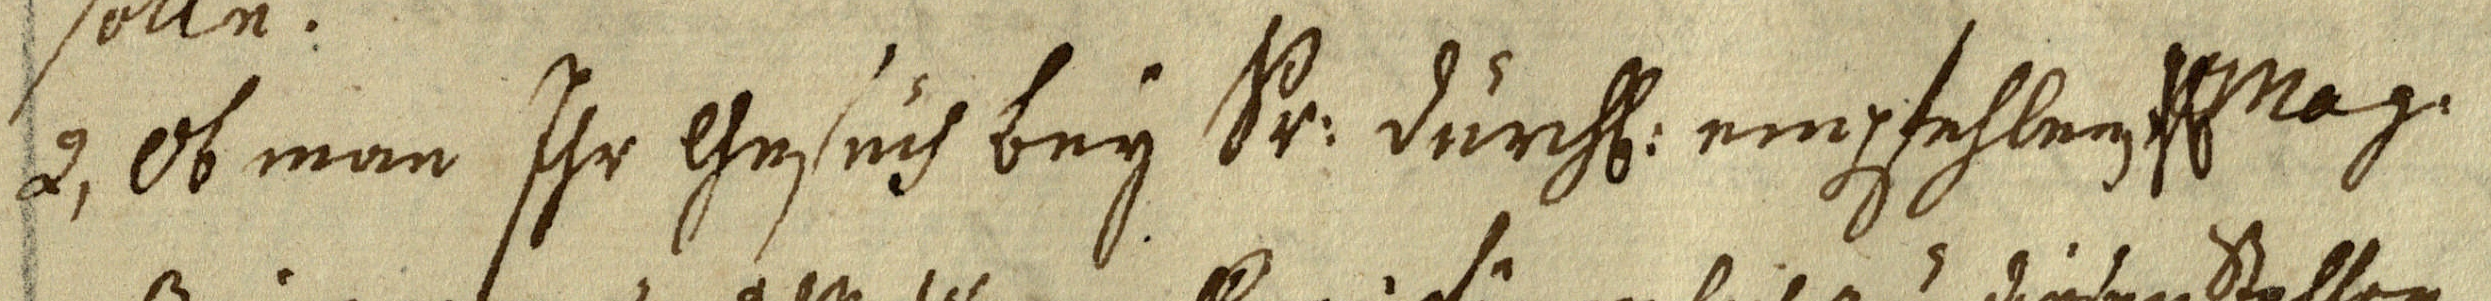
2, ob man Ihr Gesuch beÿ Sr Durchl. empfehlen, dh Mag.
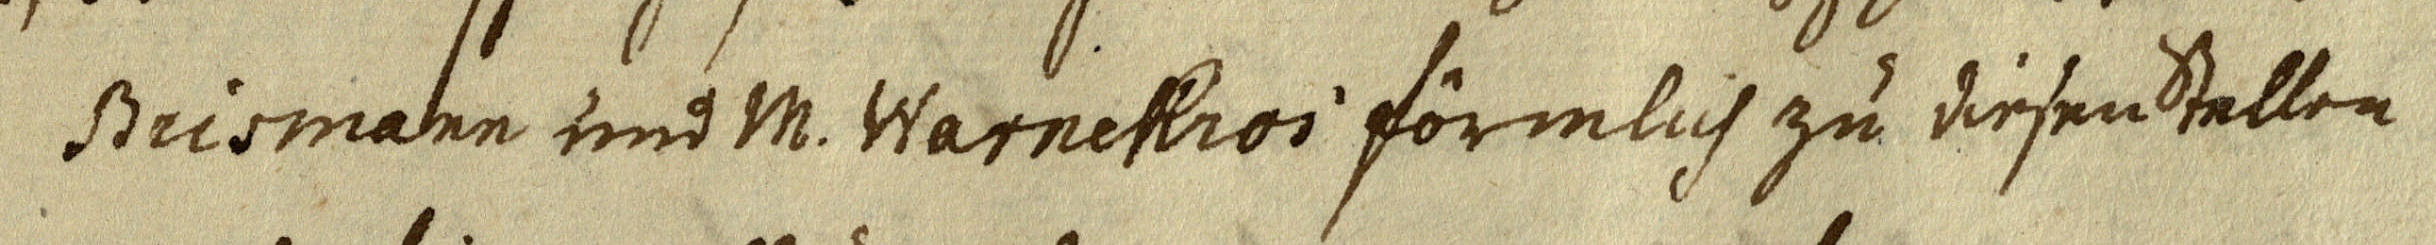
Brismann und M. Warnekros förmlich zu diesen Stellen
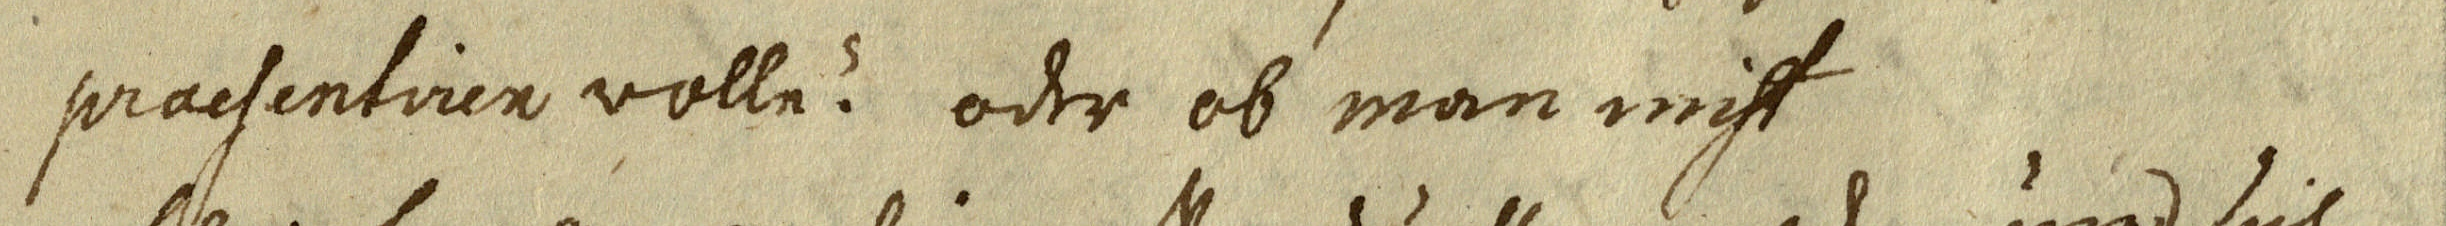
praesentiren wolle? oder ob man nicht
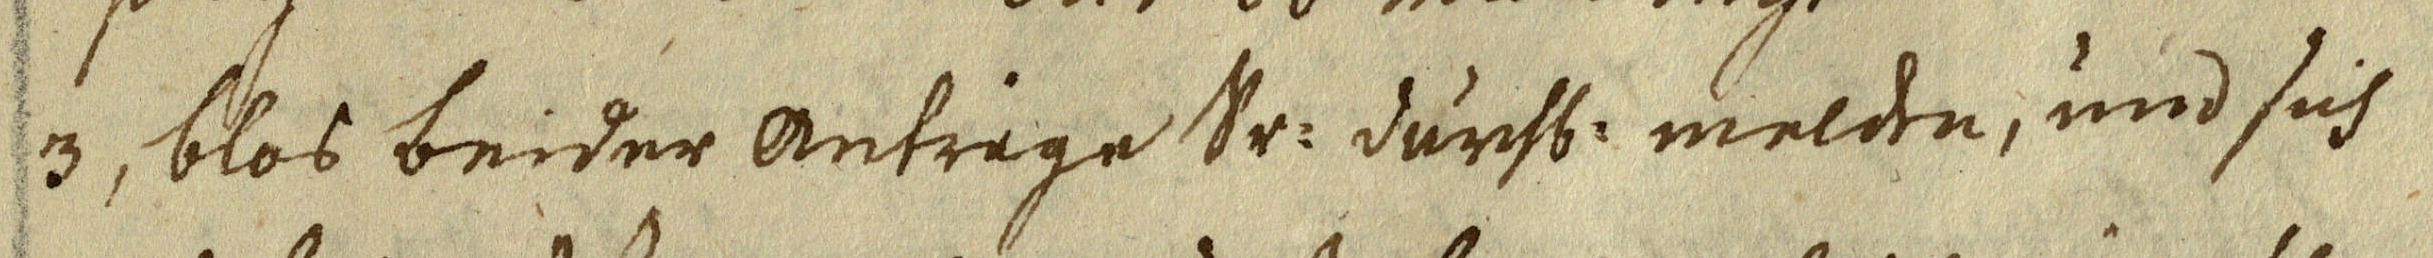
3, blos beider Anträge Sr Durchl. melden,und sich
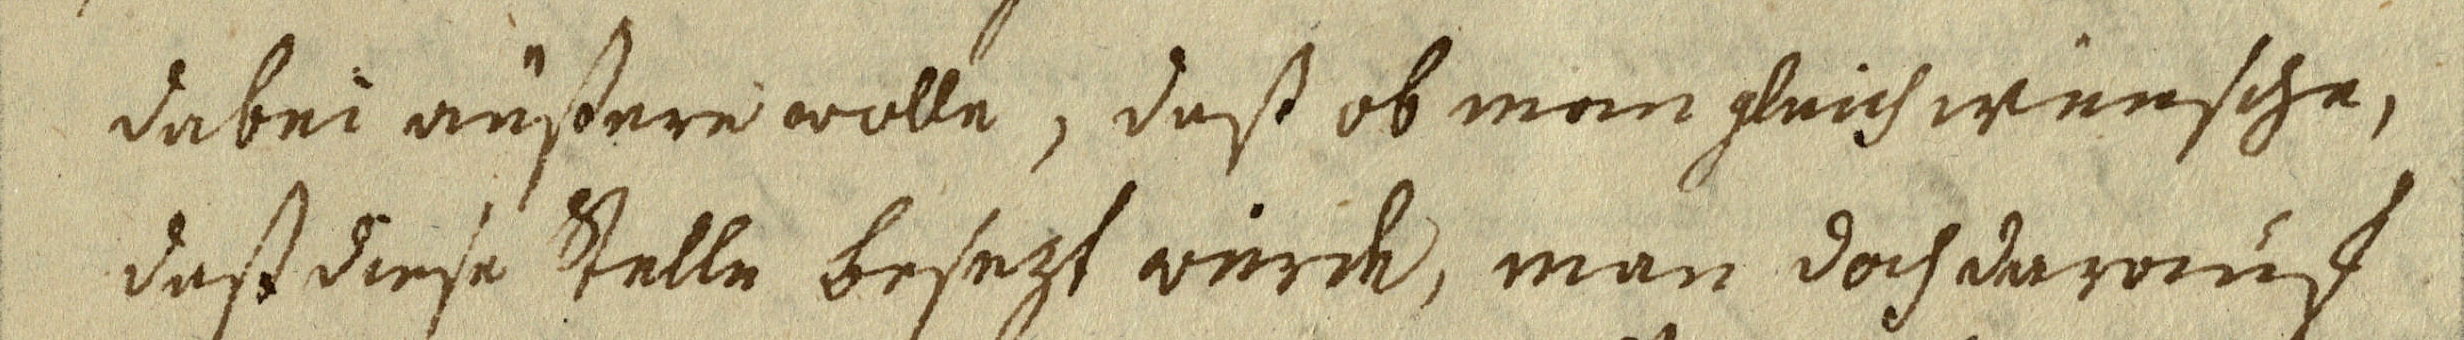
dabei äußern wolle, daß ob man gleich wünsche,
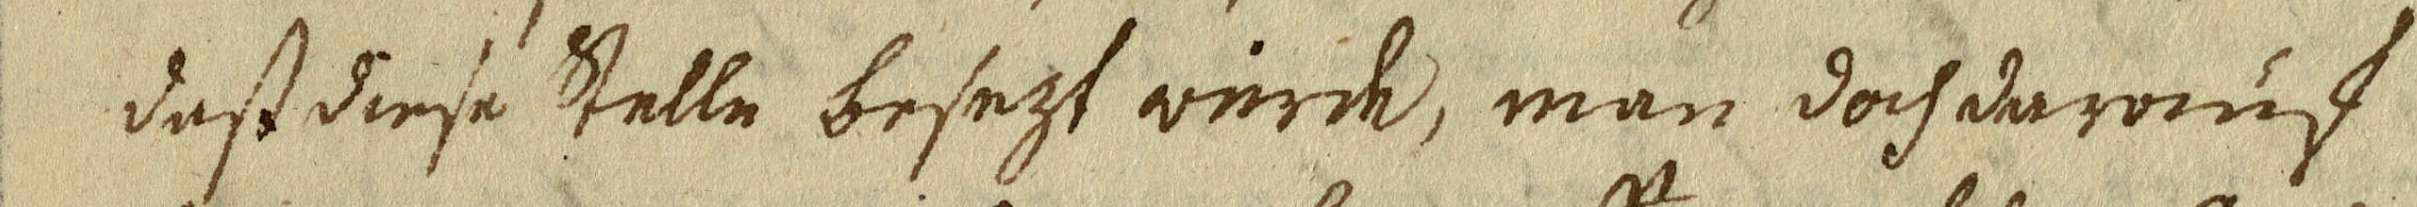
daß diese Stelle besezt würde, man doch darauf
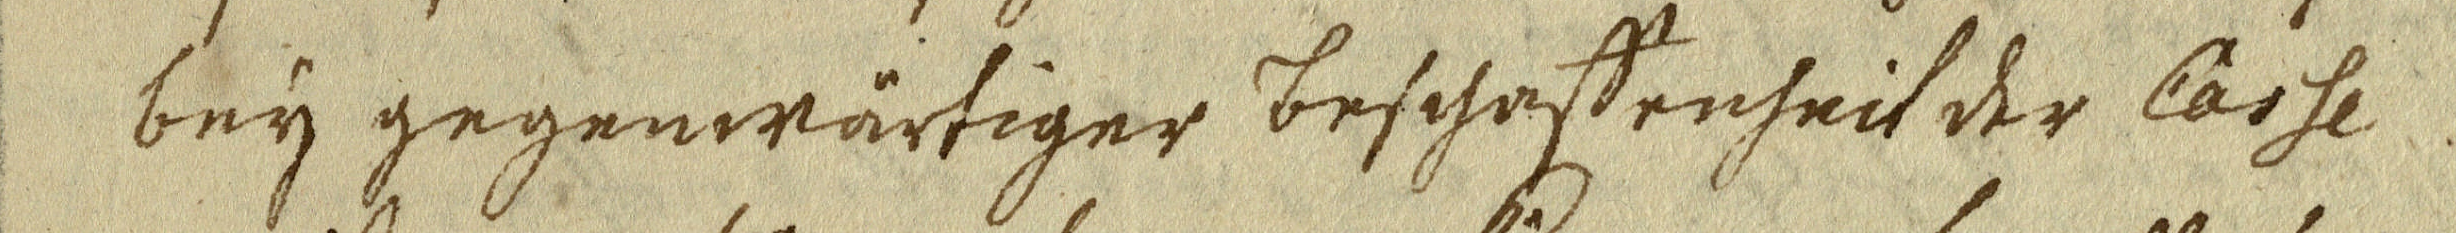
beÿ gegenwärtiger Beschaffenheit der Casse
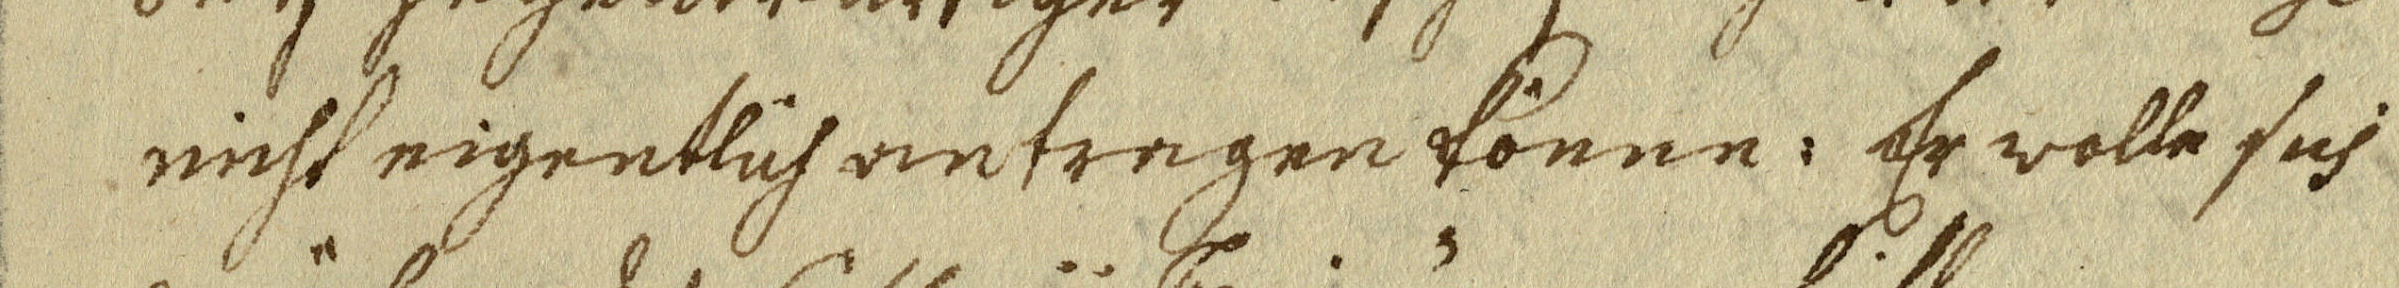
nicht eignentlich antragen könne. Er wolte sich
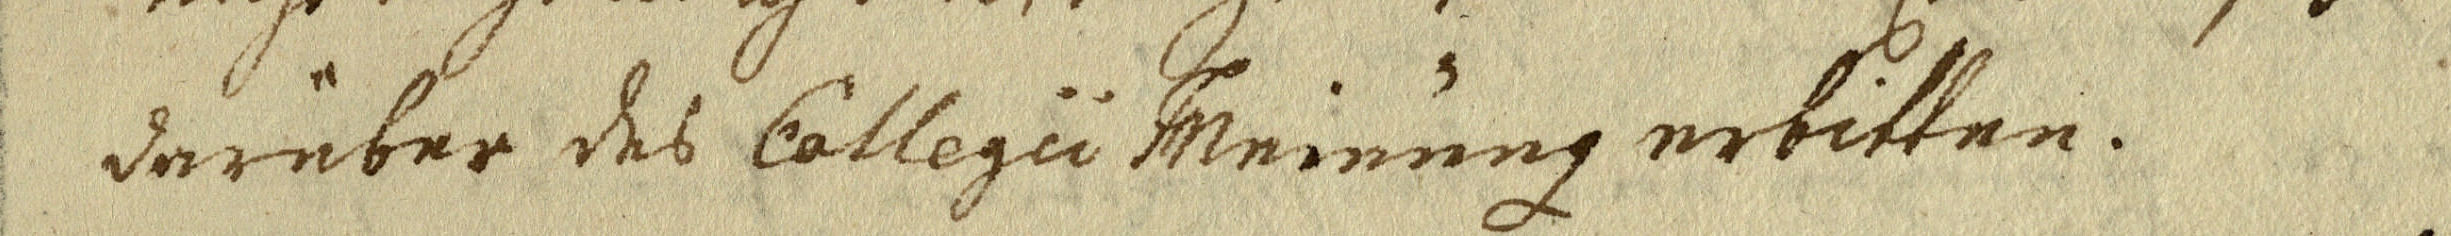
darüber des Collegii Meinung erbitten.
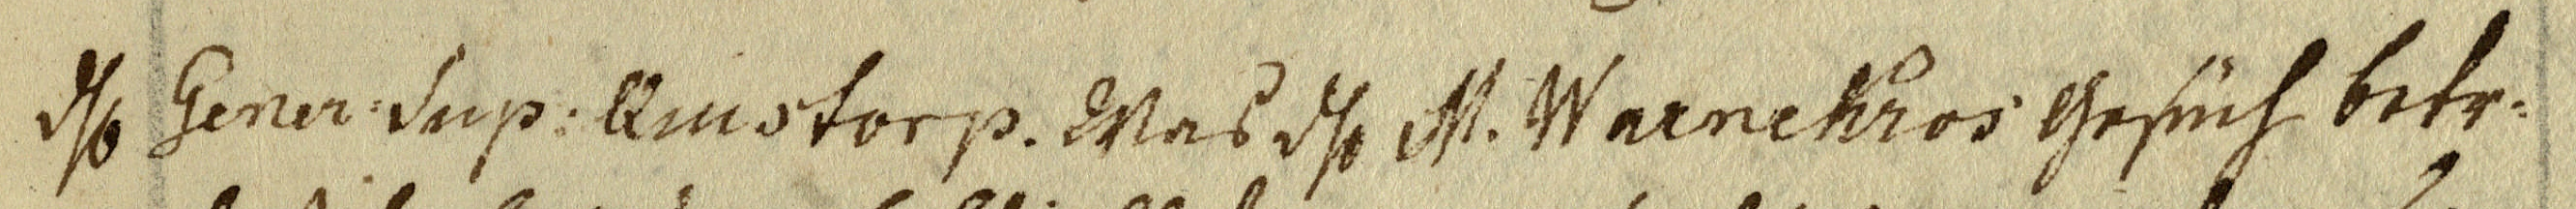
dh. Gener.Sup. Quistorp. Was dh M. Warnekros Gesuch betr.
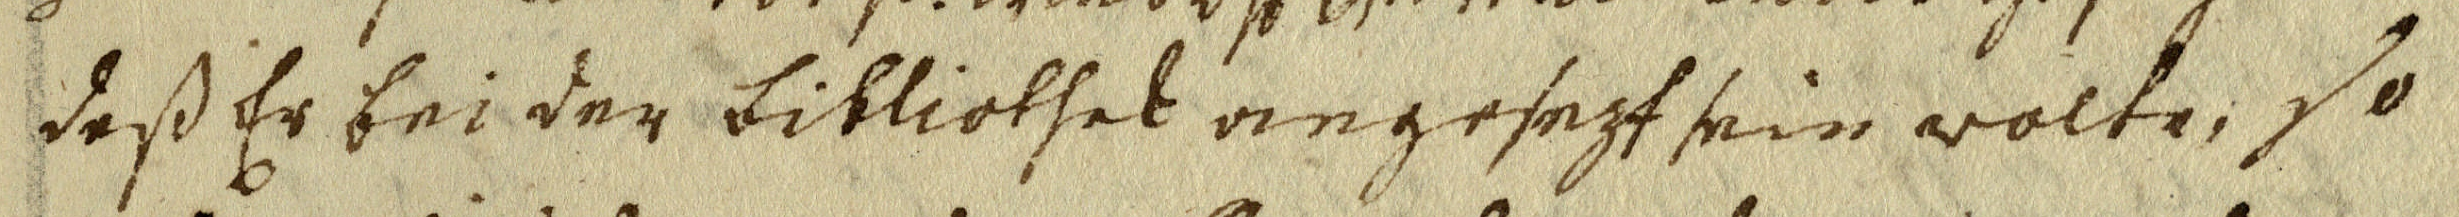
daß Er bei der Bibliothek angesezt sein wolte, so
